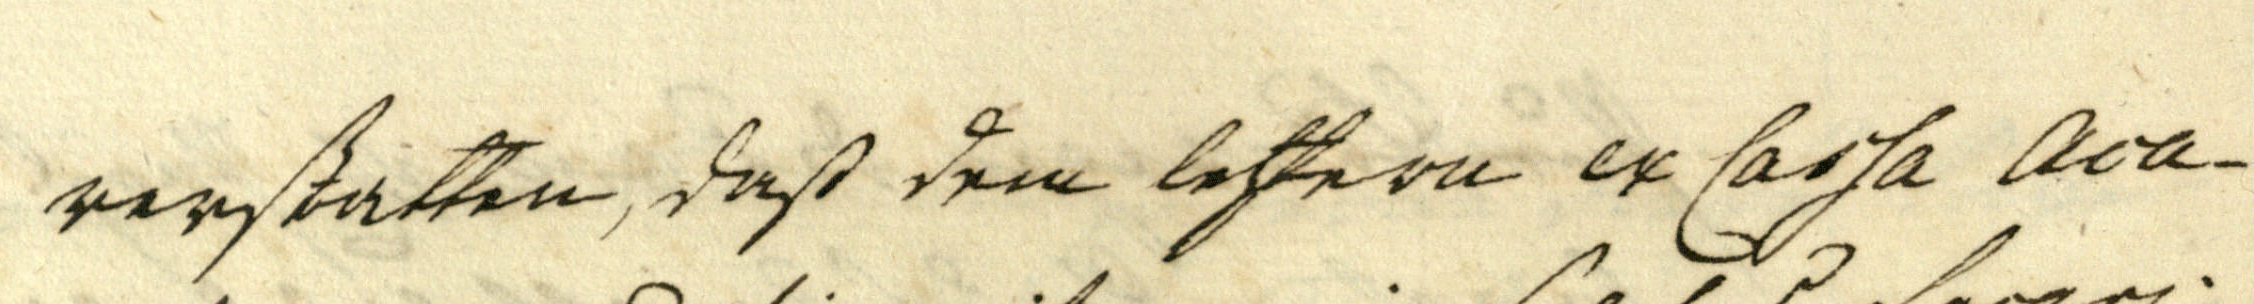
verstatten, daß dem letztern ex Cassa Aca¬
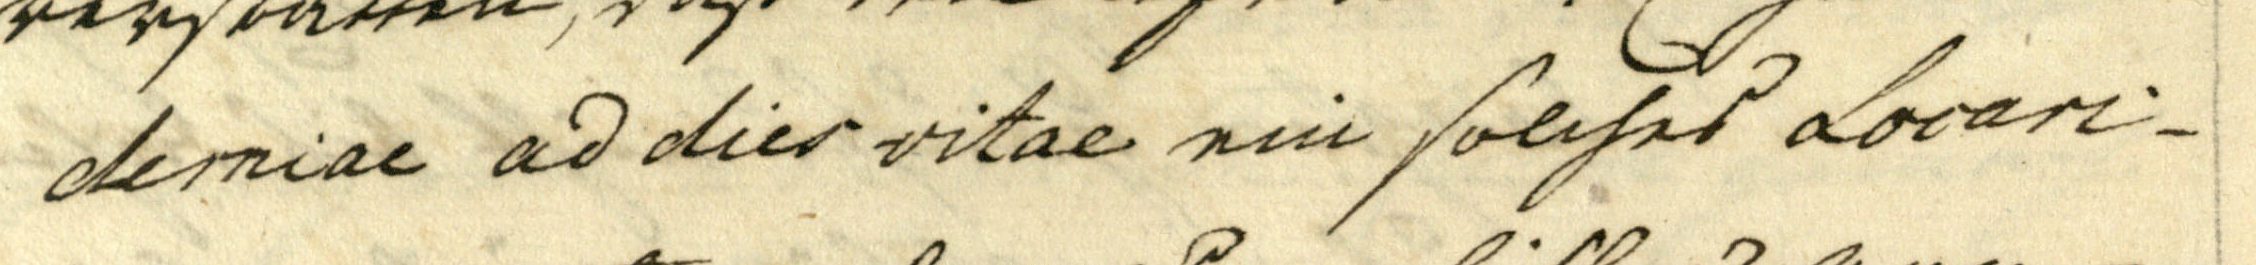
demiae ad dies vitae ein solches Locari¬
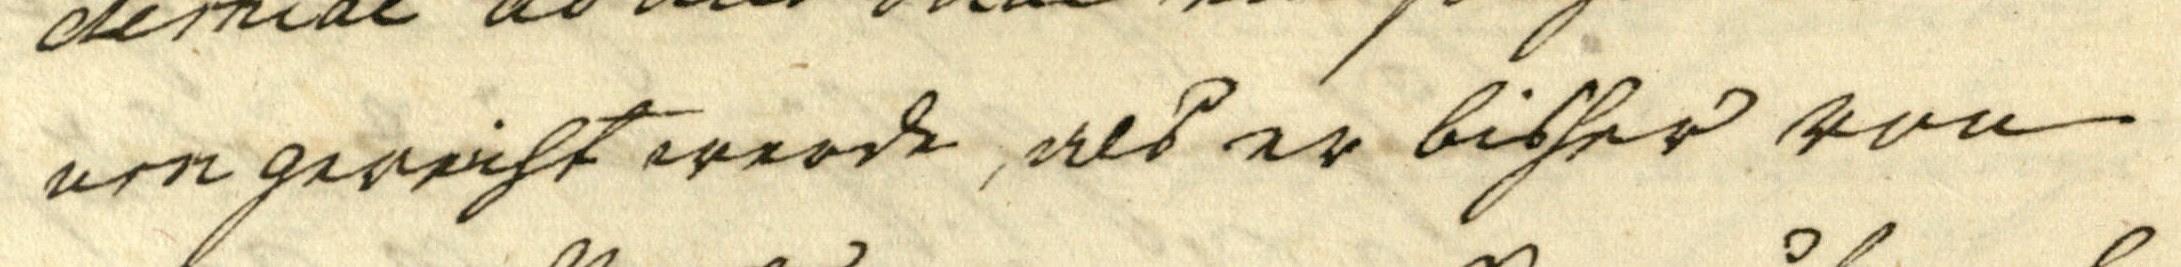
um gereicht werde, als er bisher von
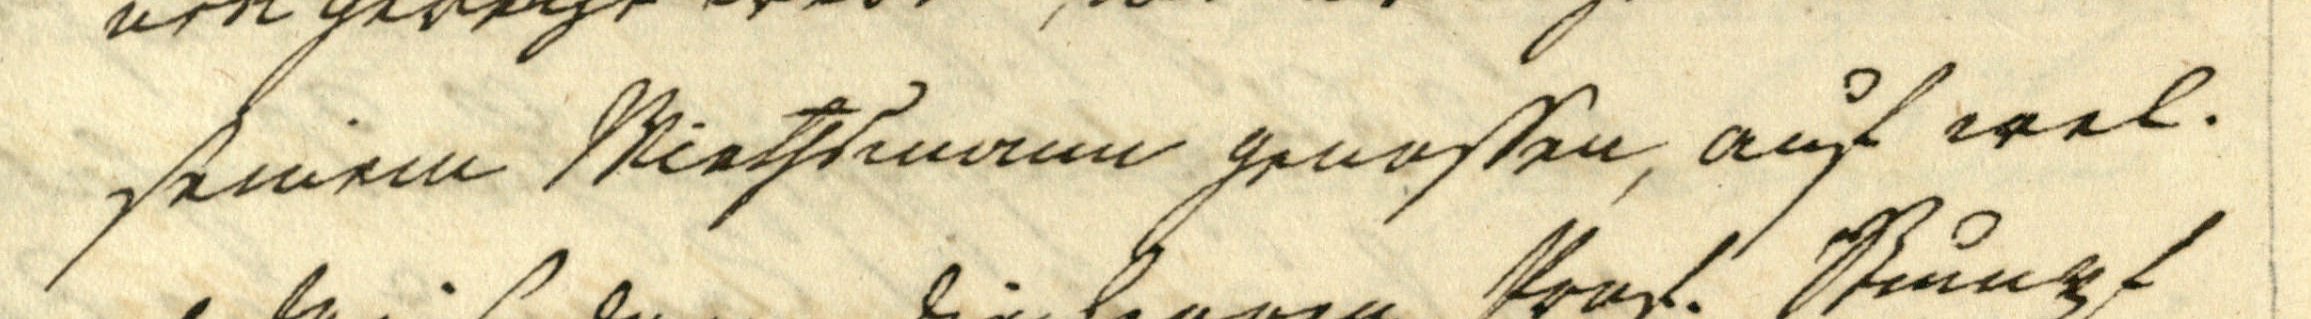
seinem Miethsmann genossen, auf wel¬
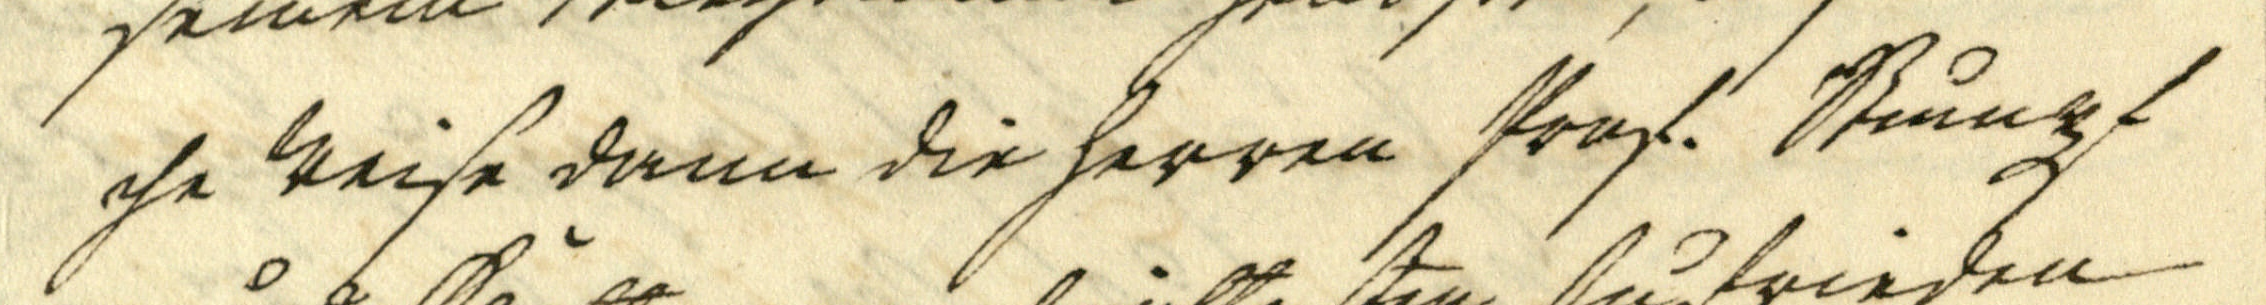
che Weise dann die Herren Prof. Stumpf
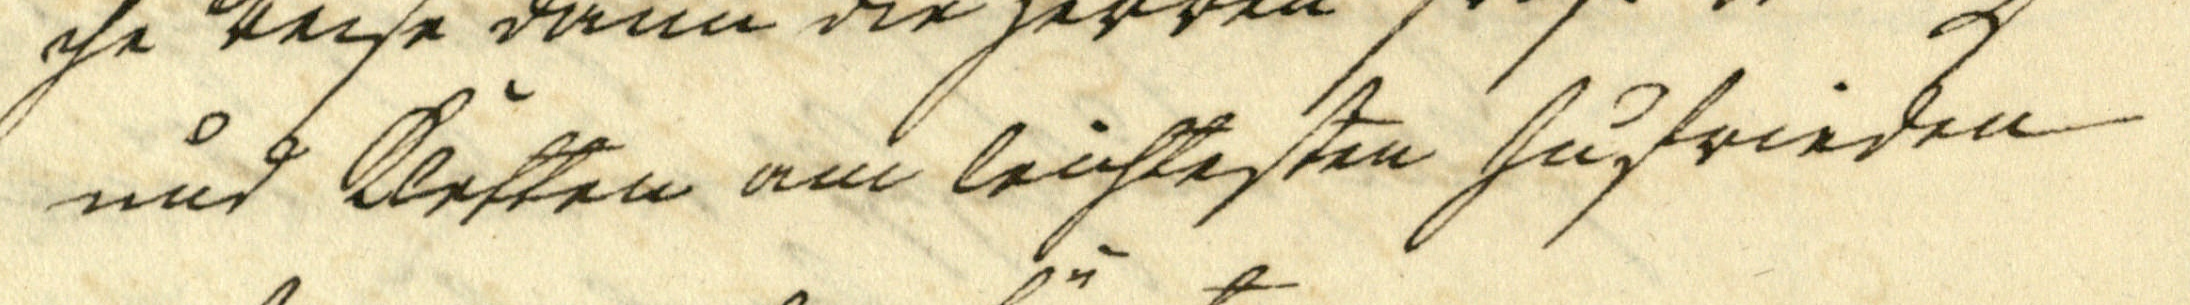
und Kletten am leichtesten zufrieden
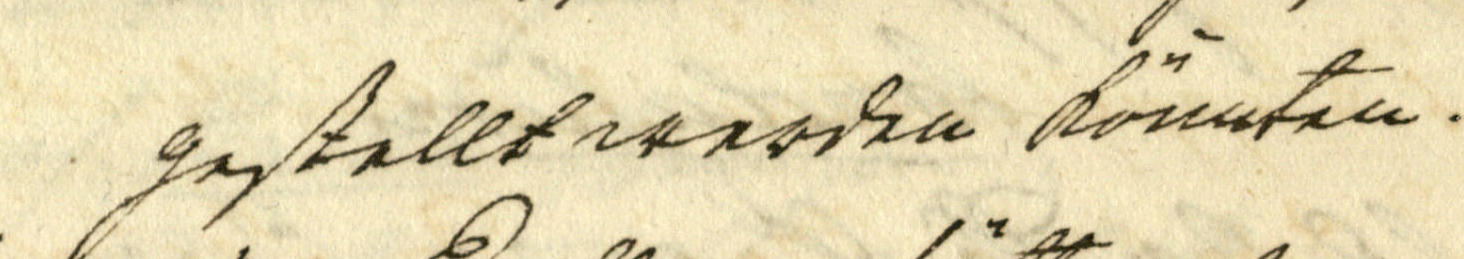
gestellt werden könnten.
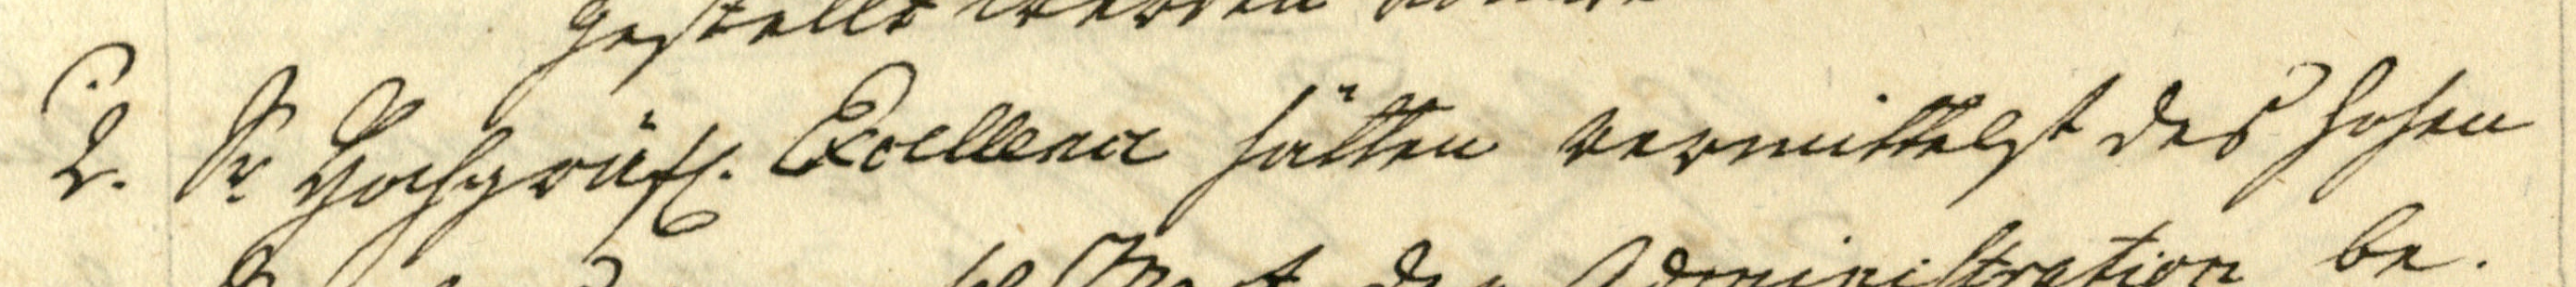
2. Sr Hochgräfl. Excellence hätten vermittelst des hohen
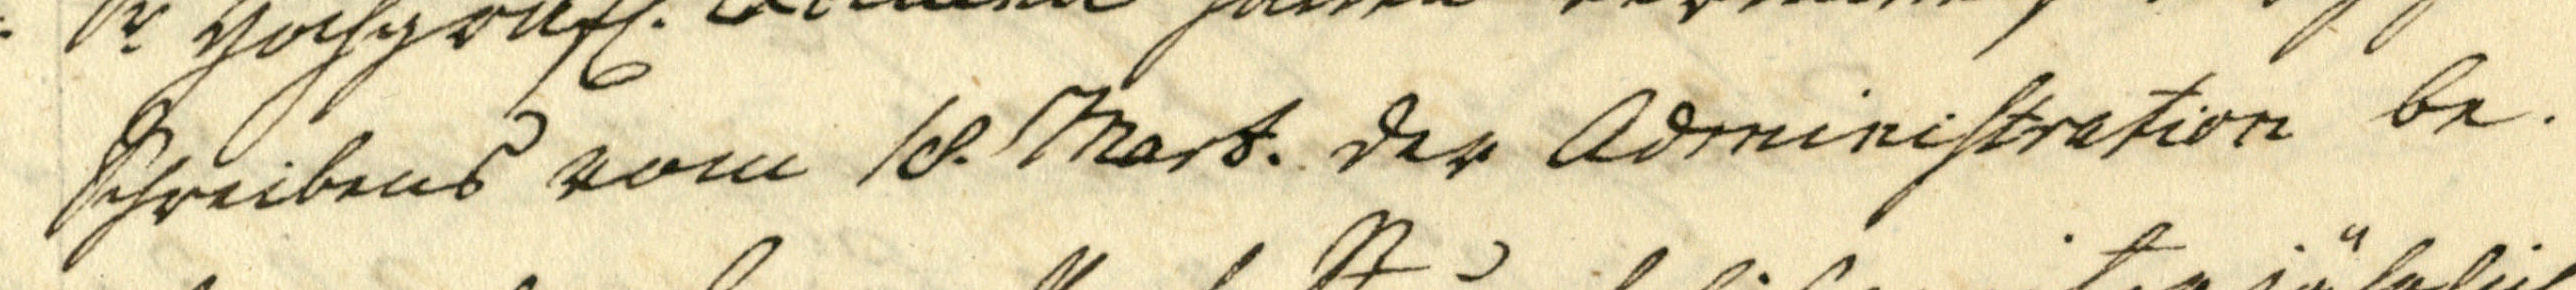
Schreibens vom 18 Mart. der Administration be¬
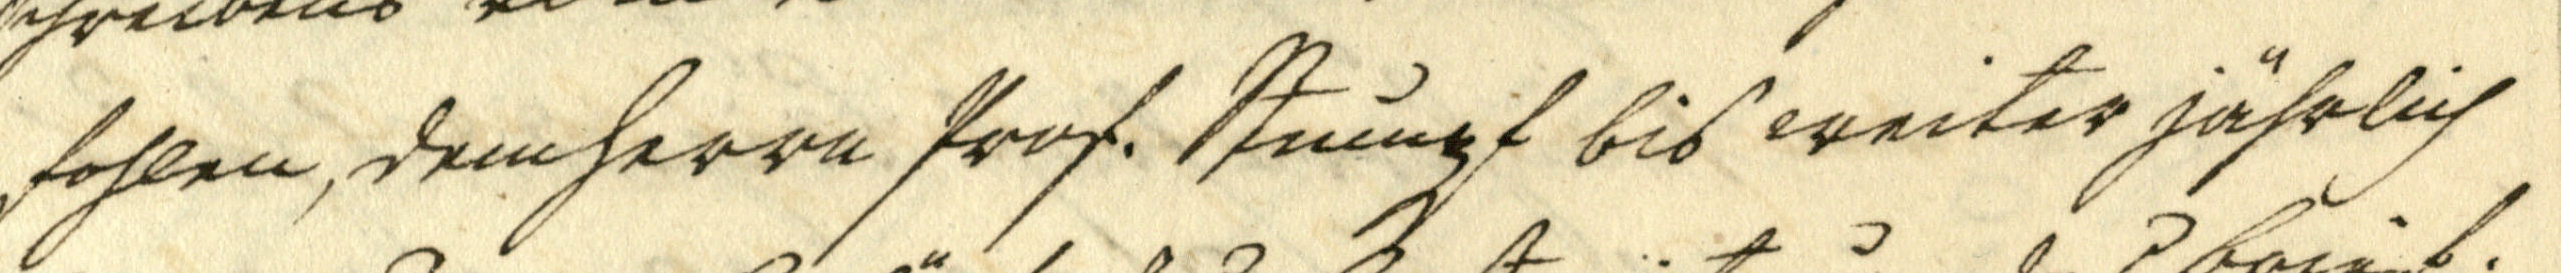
fohlen, dem Herrn Prof. Stumpf bis weiter jährlich
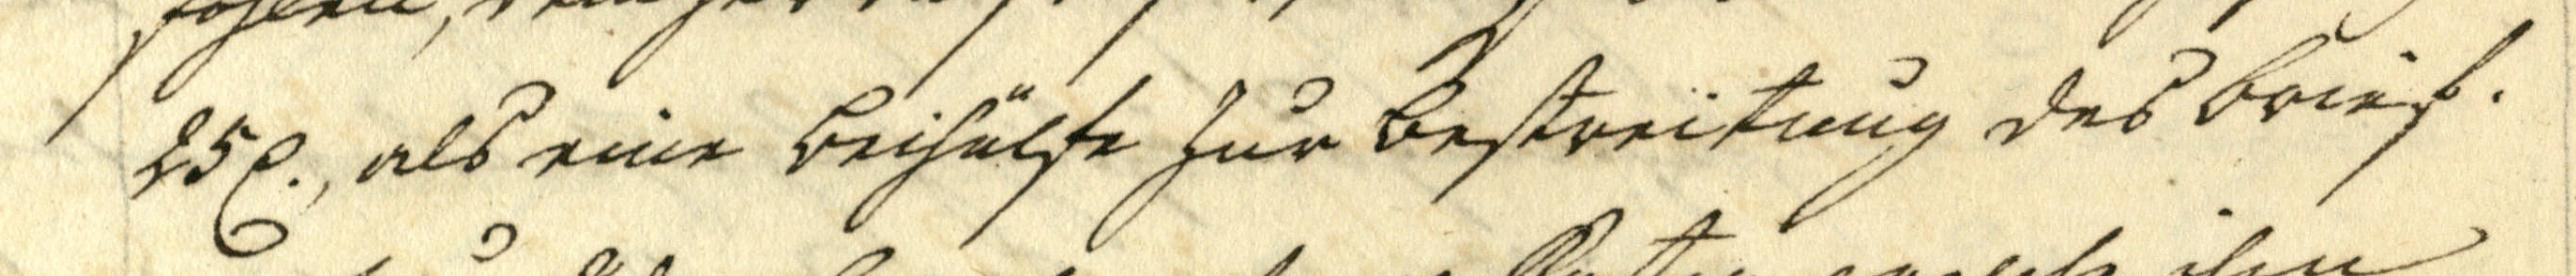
25 l. als eine Beihülfe zur Bestreitung des Brief¬
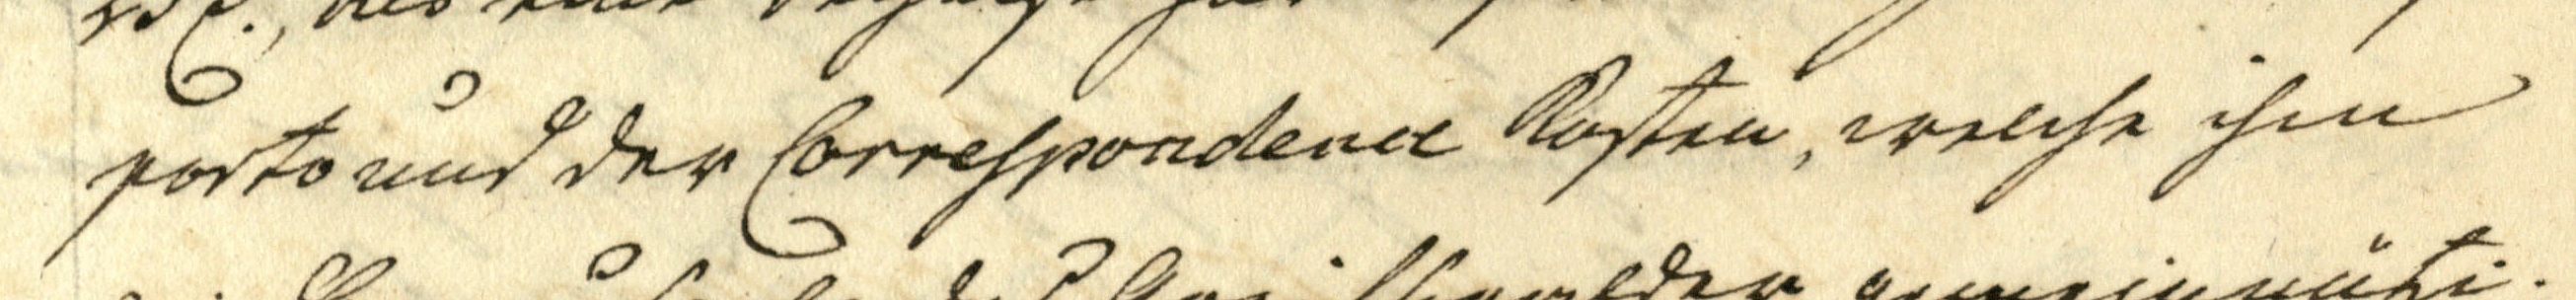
porto und der Correspondence, welche ihm
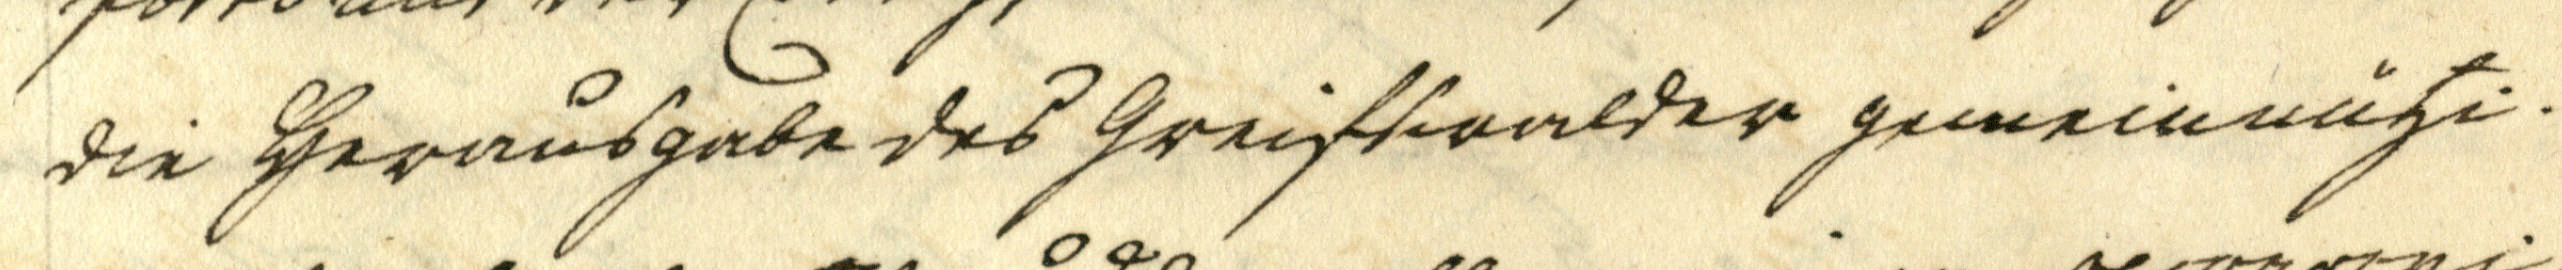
die Herausgabe des Greifswalder gemeinnützi¬
